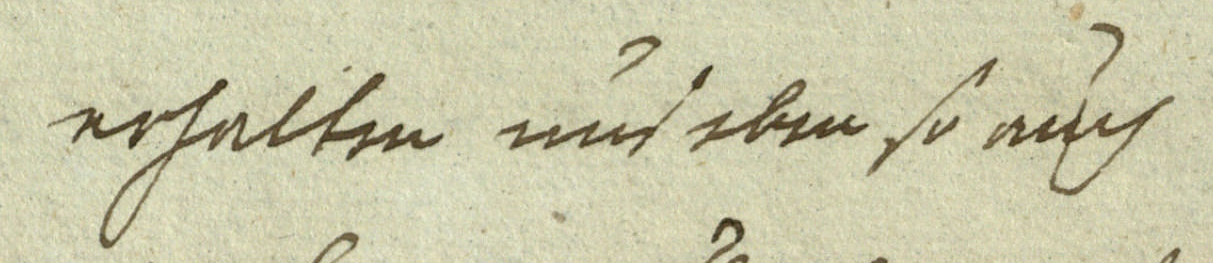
erhalten und eben so auch
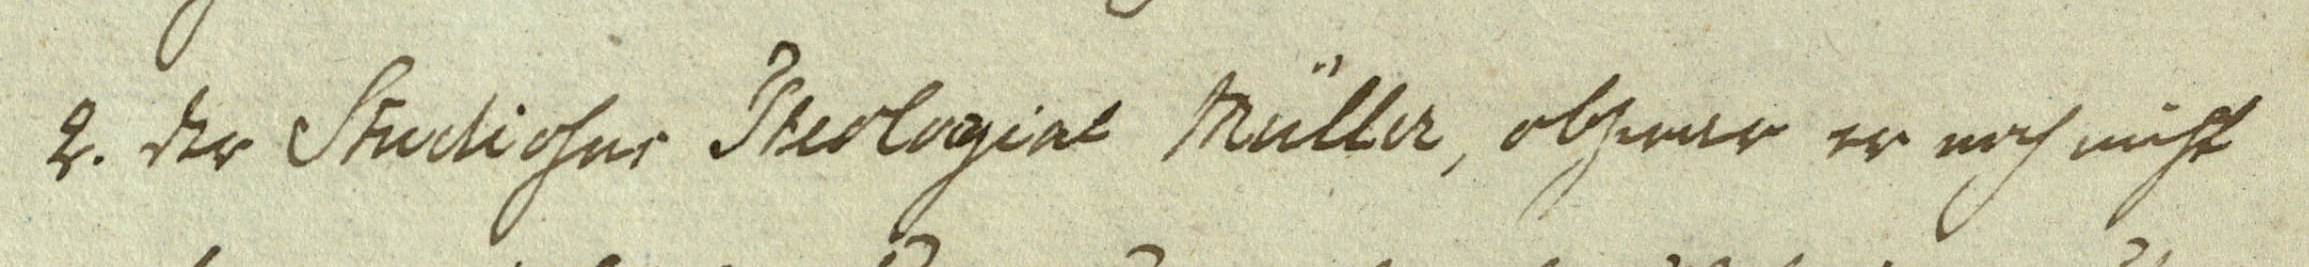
2. der Studiosus Theologiae Müller, obzwar er noch nicht
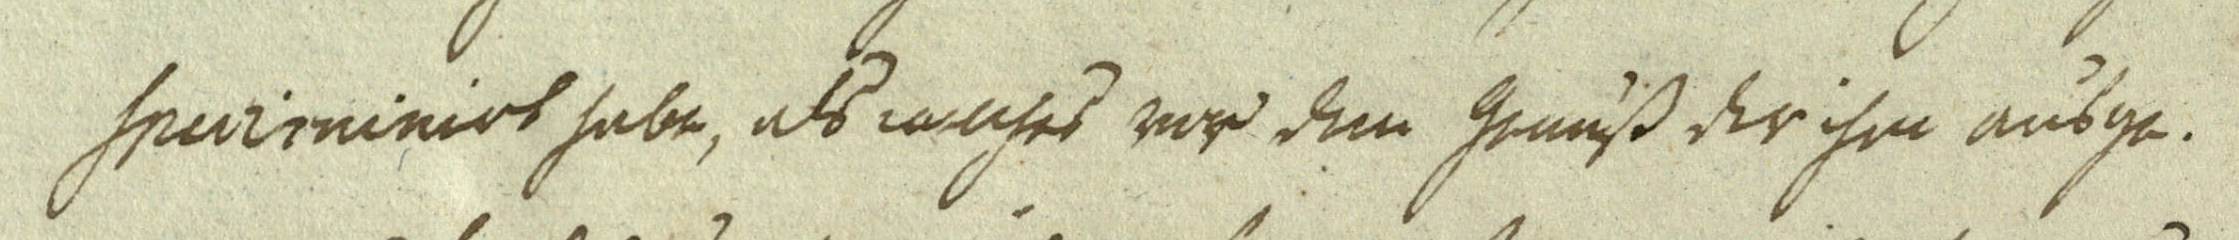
speciminirt habe, als welches vor dem Genuß der ihm ausge¬
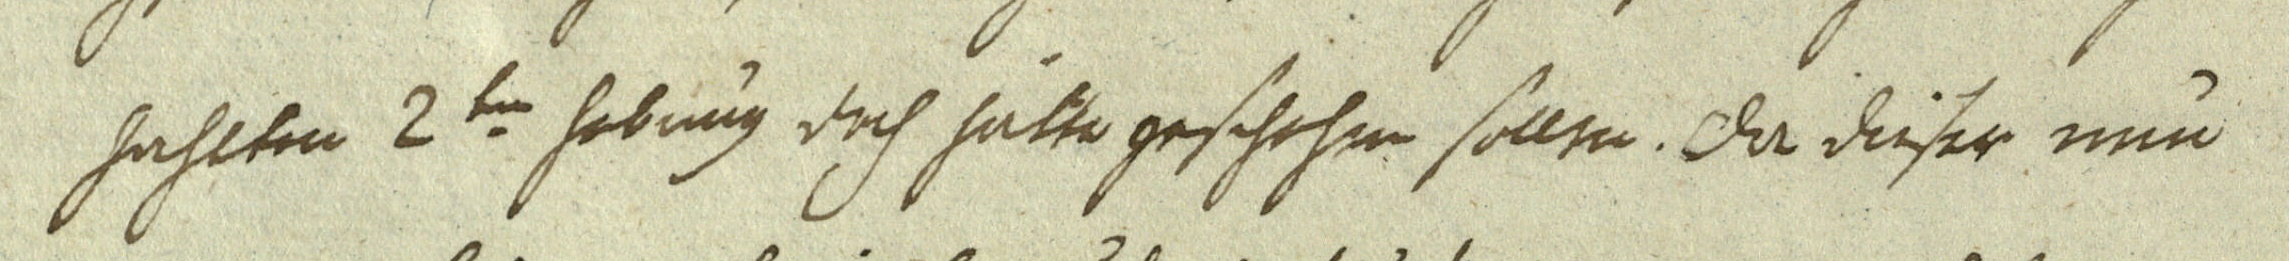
zahlten 2 ten Hebung doch hätte geschehen sollen. Da dieser nun
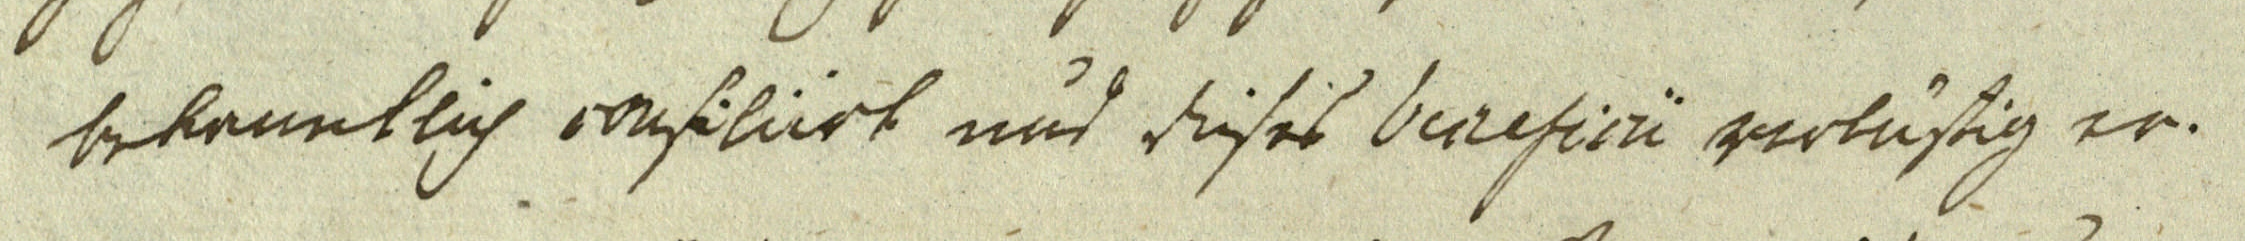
bekanntlich consiliirt und dieses beneficii verlustig er¬
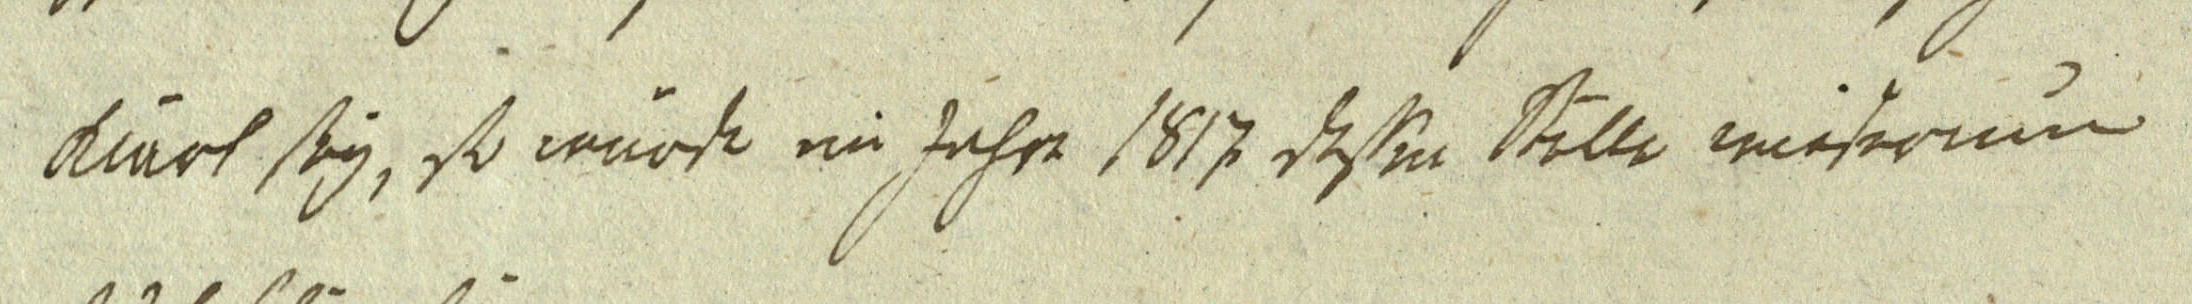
klärt seÿ, so würde im Jahre 1817 dessen Stelle wiederum
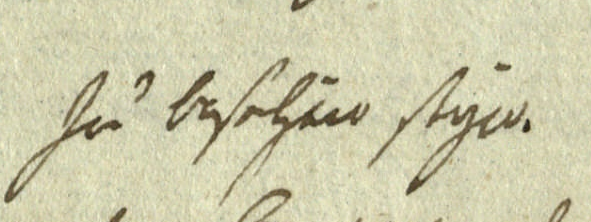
zu besetzen seÿn.
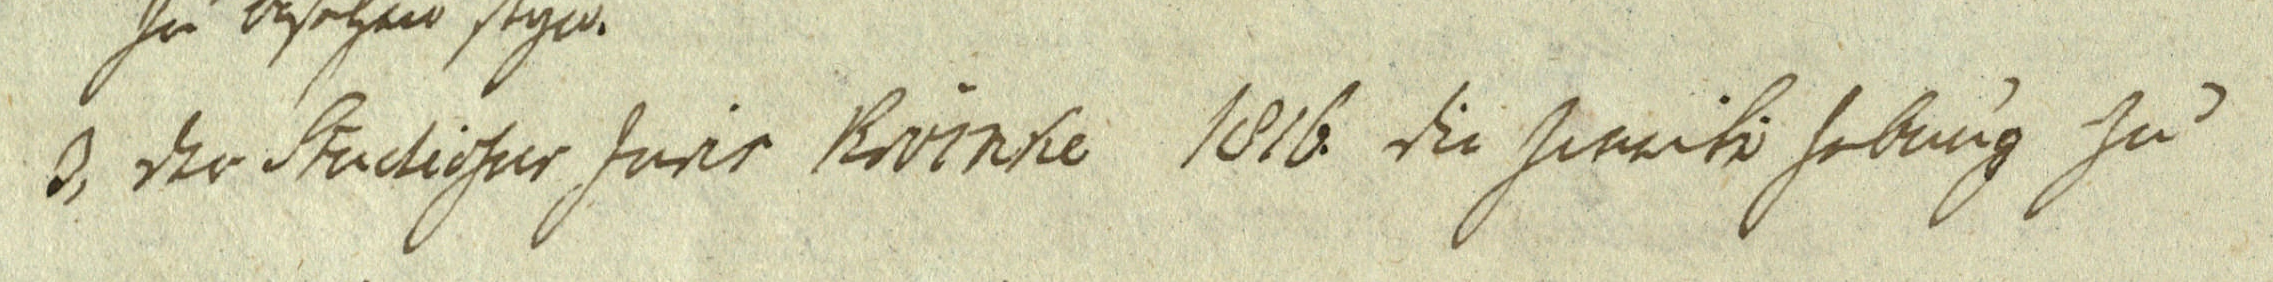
3, der Studiosus Juris Krömke 1816. die zweite Hebung zu
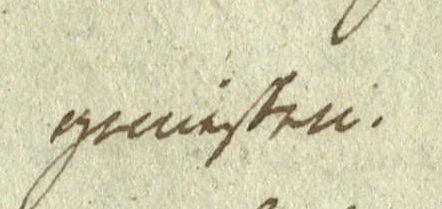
geniessen.
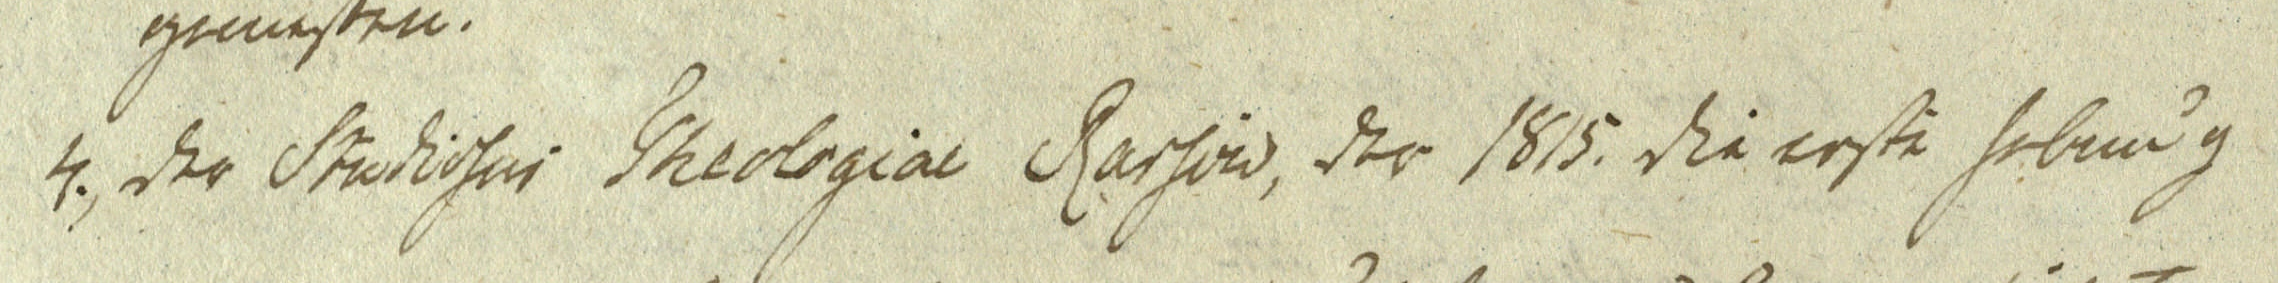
4, der Studiosus Theologiae Rassow, der 1815. die erste Hebung
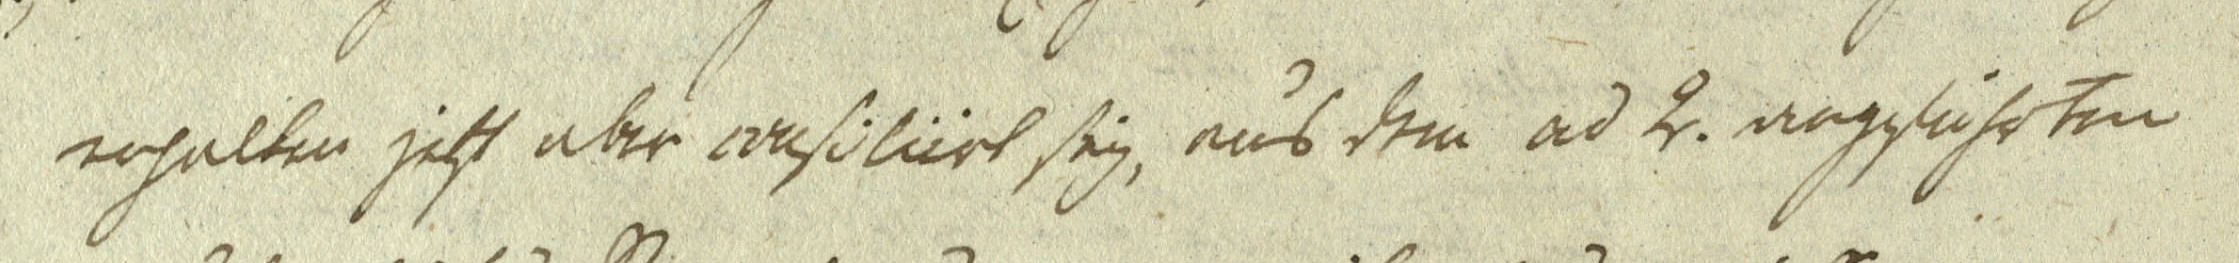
erhalten jetzt aber consiliirt seÿ, aus dem ad 2. angeführten
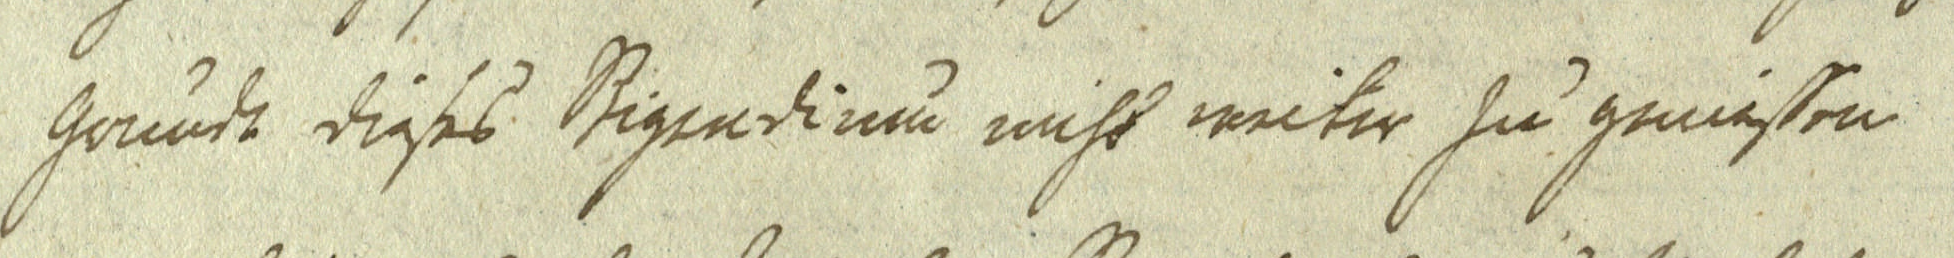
Grunde dieses Stipendium nicht weiter zu geniessen
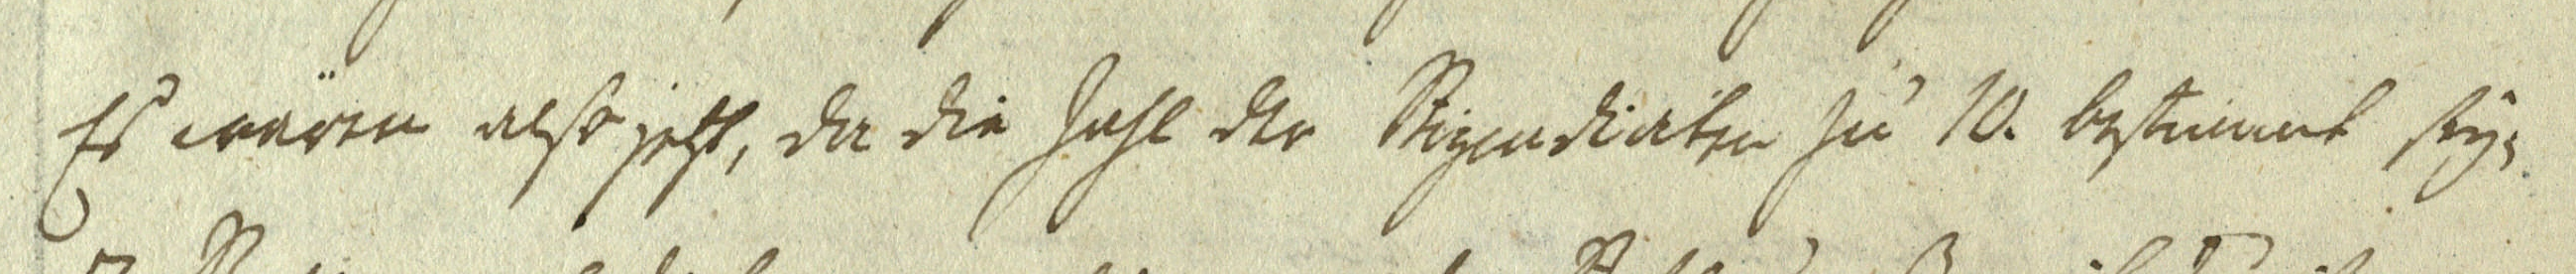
Es wären also jetzt, da die Zahl der Stipendiaten zu 10. bestimmet seÿ,
